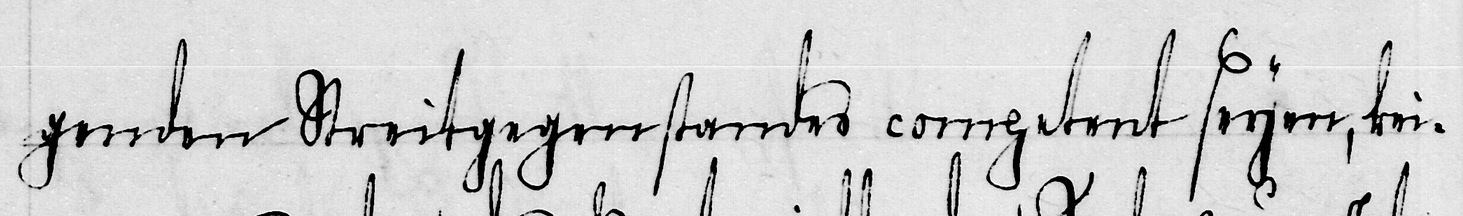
genden Streitgegenstandes competent seyen, kei¬
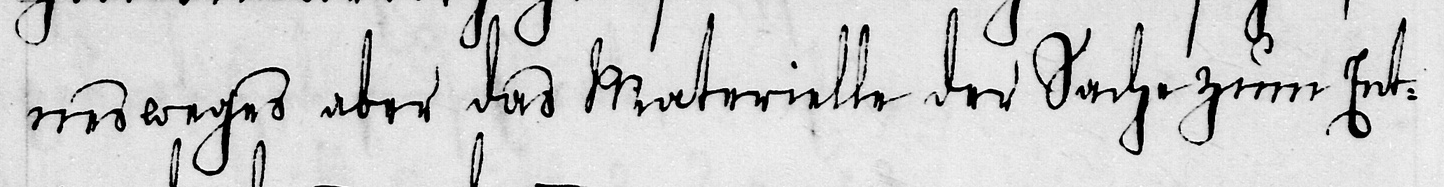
nesweges aber das Materielle der Sache zum Ent¬
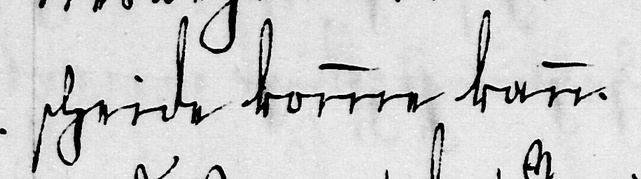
scheide komme kann.
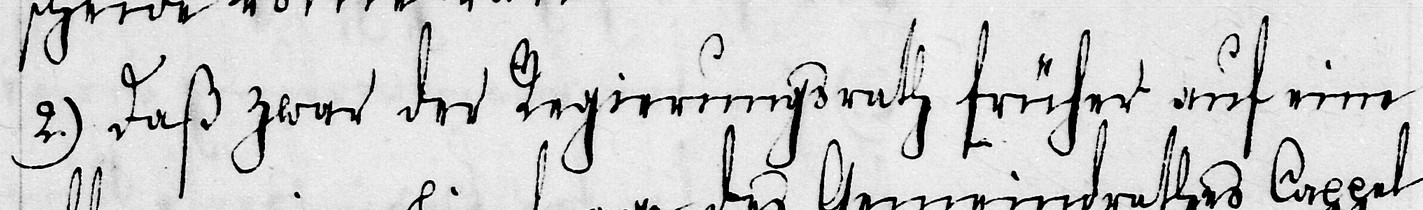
2.) Daß zwar der Regierungsrath früher auf eine
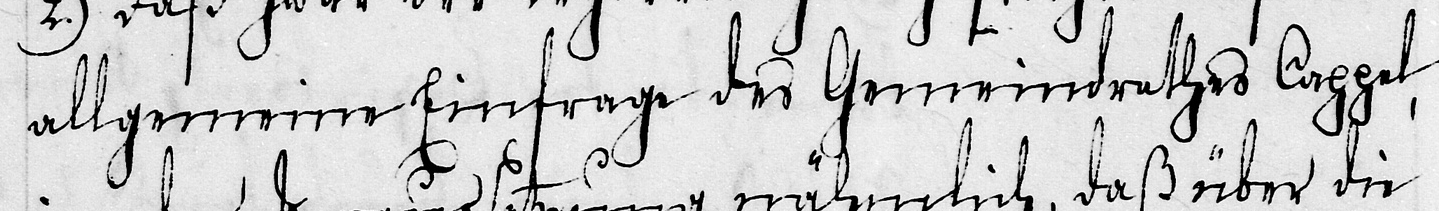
allgemeine Einfrage des Gemeindrathes Cappel,
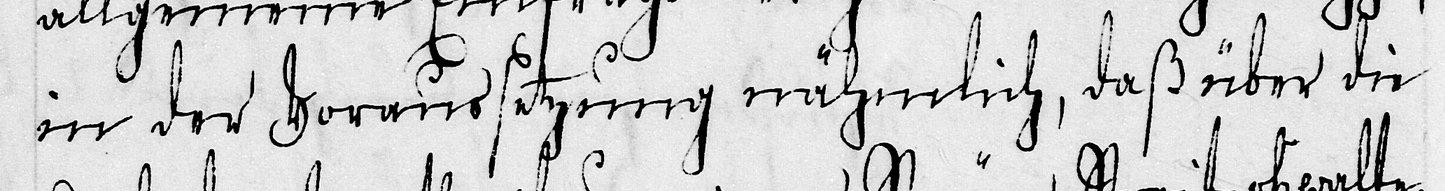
in der Voraussetzung nähmlich, daß über die
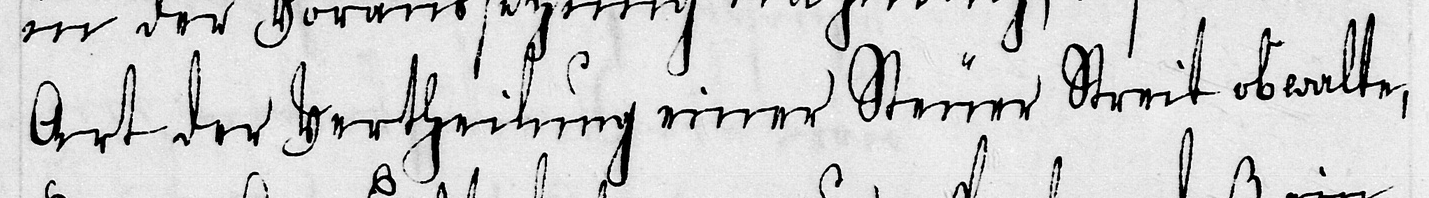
Art der Vertheilung einer Steuer Streit obwalte,
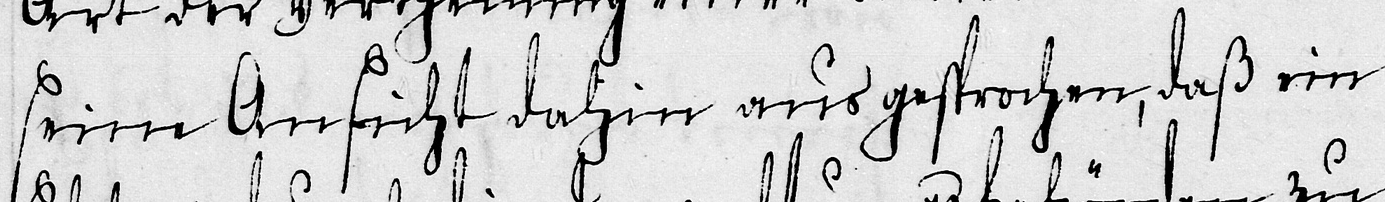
seine Ansicht dahin ausgesprochen, daß ein
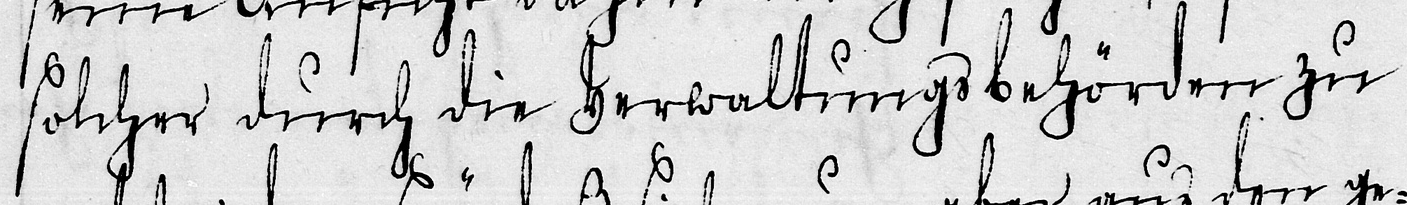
solcher durch die Verwaltungsbehörden zu
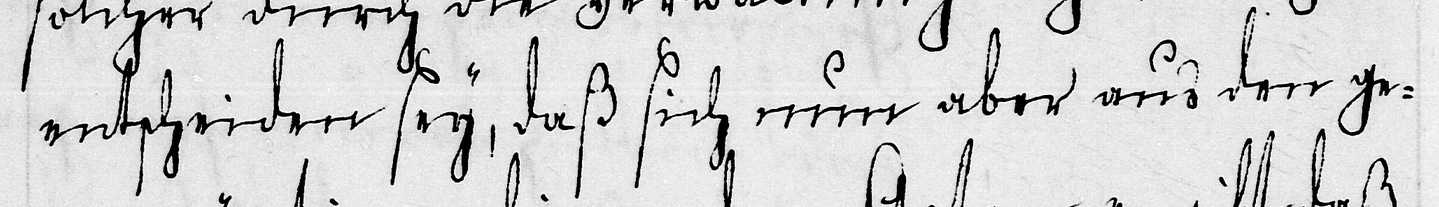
entscheiden sey, daß sich nun aber aus den ge¬
